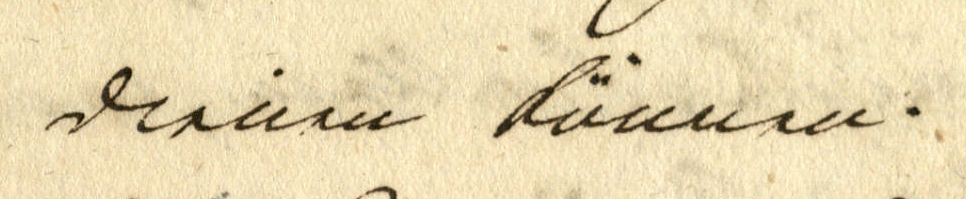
dienen können.
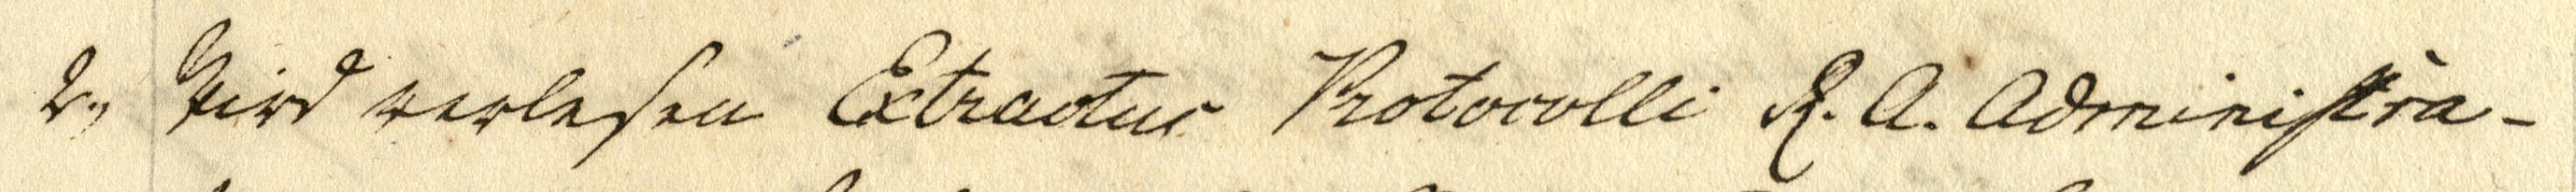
2. Wird verlesen Extractus Protocolli K. A. Administra-
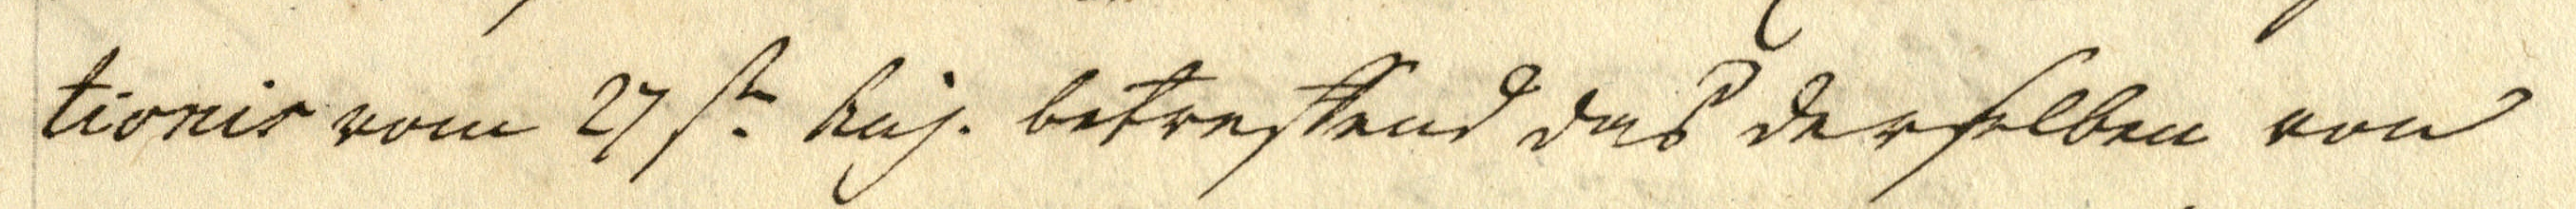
tionis vom 27sten huj. betreffend das derselben von
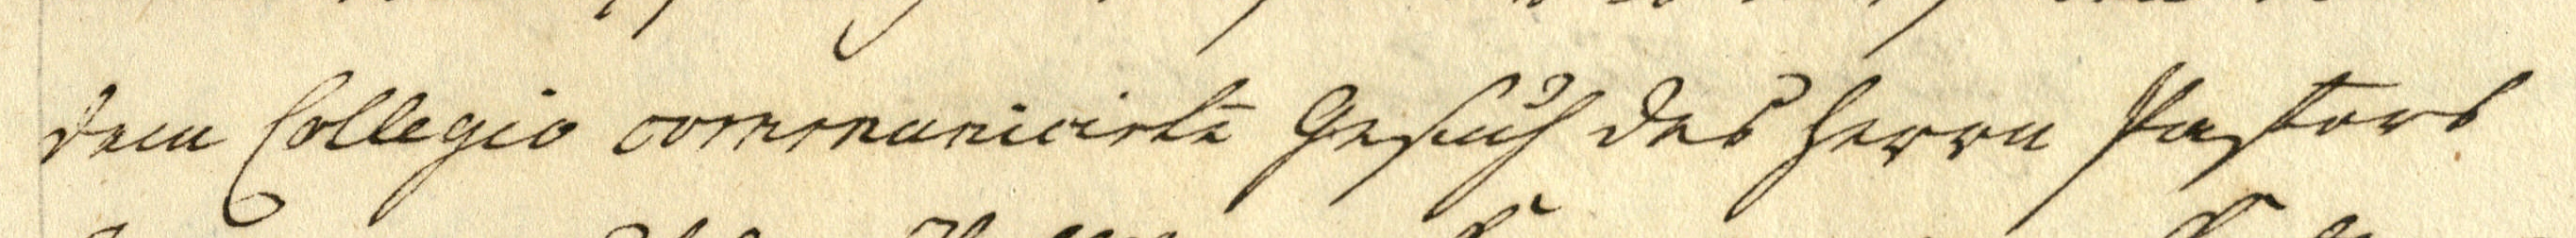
dem Collegio communicirte Gesuch des Herrn Pastors
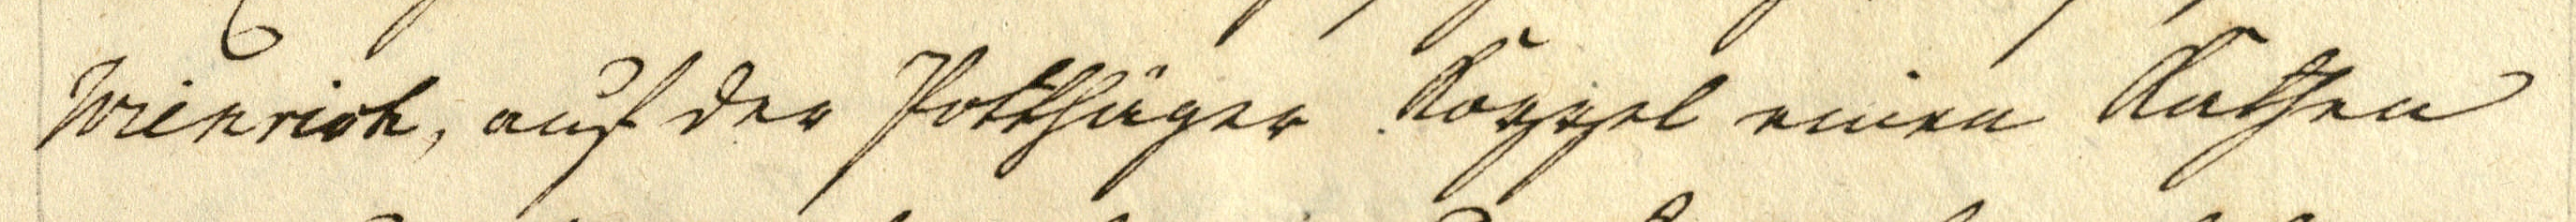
Wienrich, auf der Potthäger Koppel einen Kathen
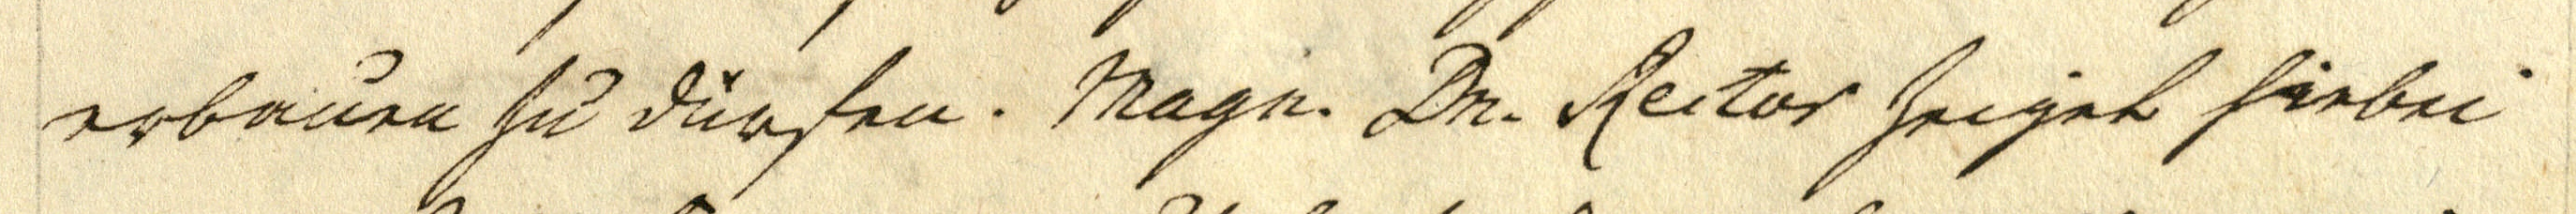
erbauen zu dürfen. Magn. Dn. Rector zeiget hiebei
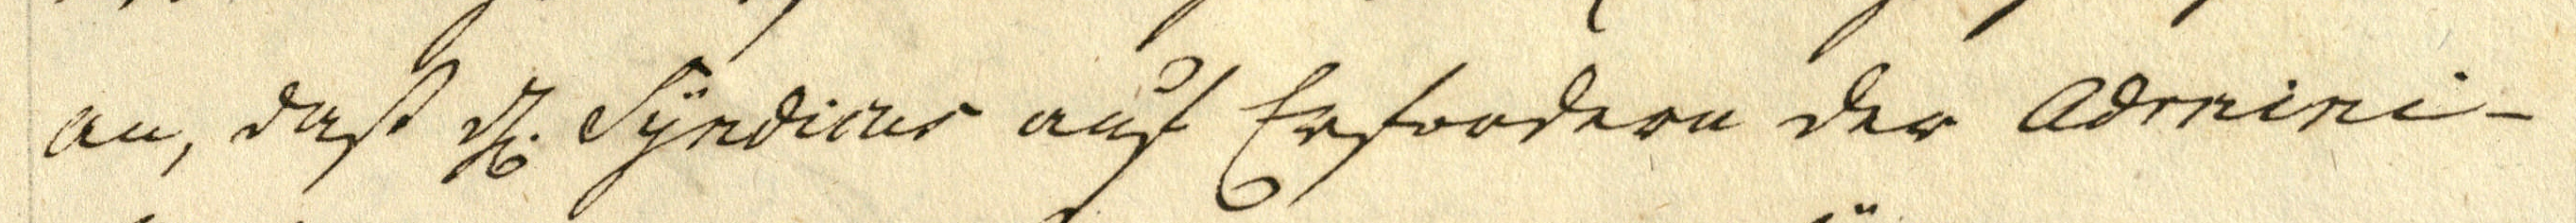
an, daß dh. Syndicus auf Erfordern der Admini-
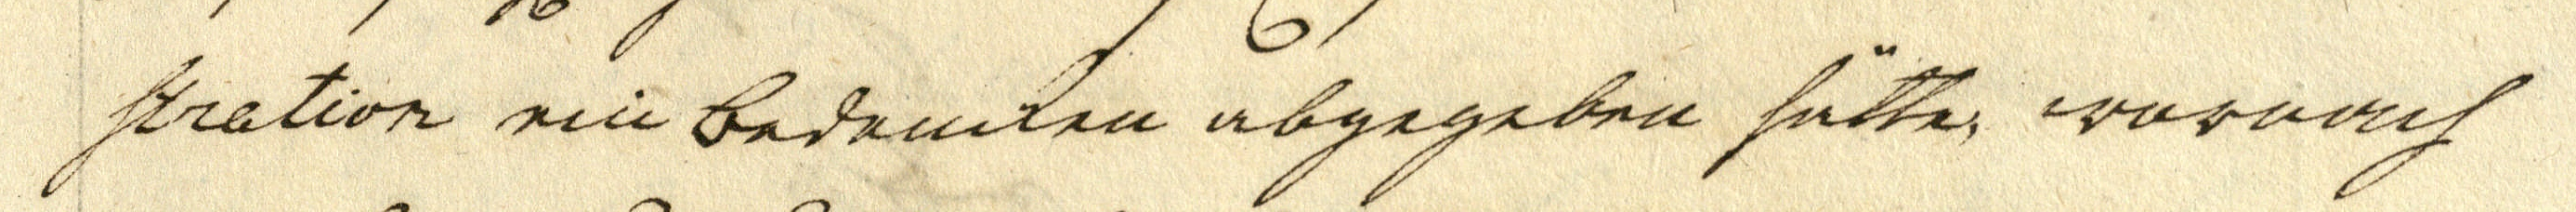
stration ein Bedenken abgegeben hätte, wornach
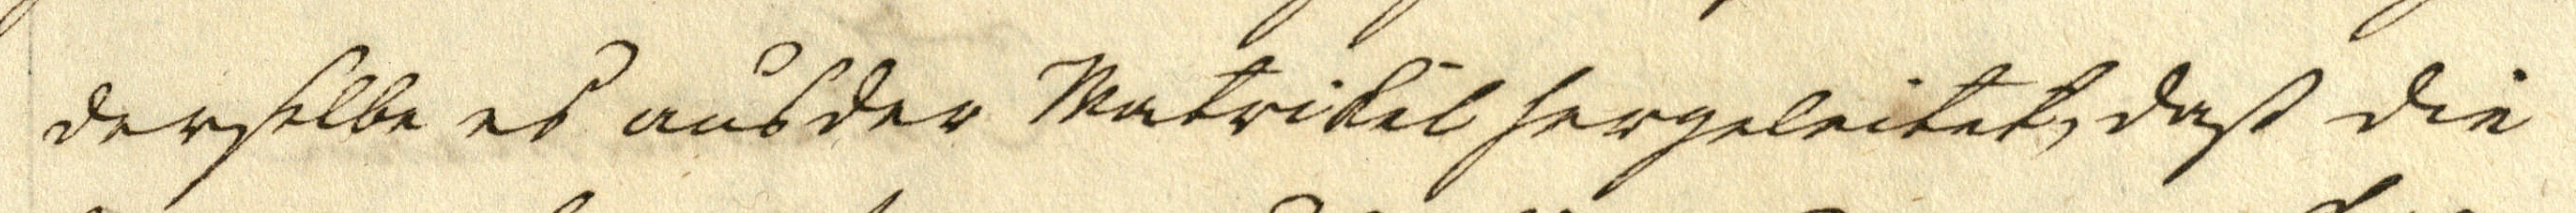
derselbe es aus der Matrikel hergeleitet, daß die
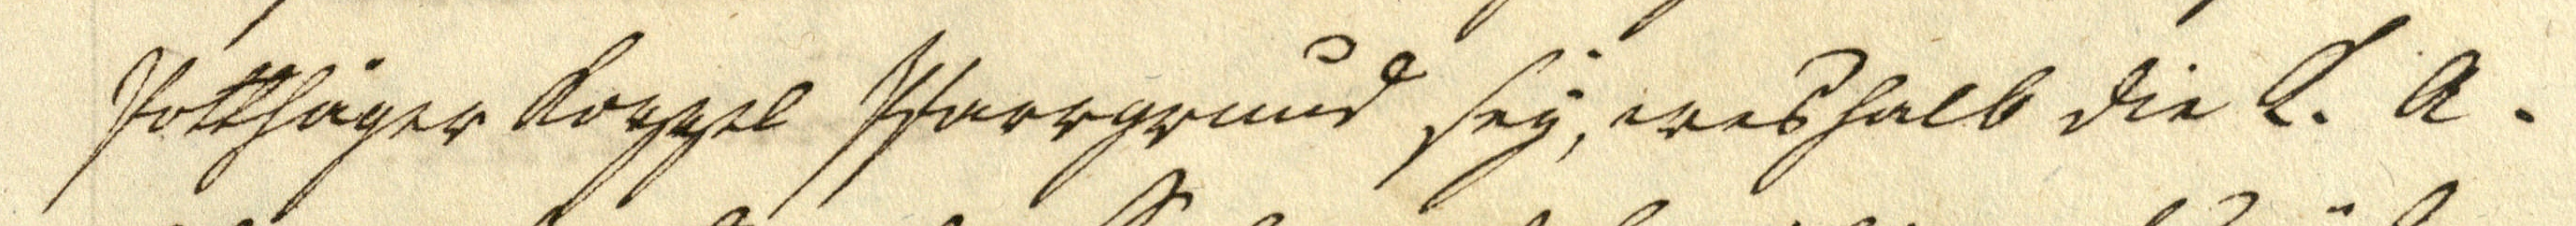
Potthäger Koppel Pfarrgrund sey, weshalb die K. A.
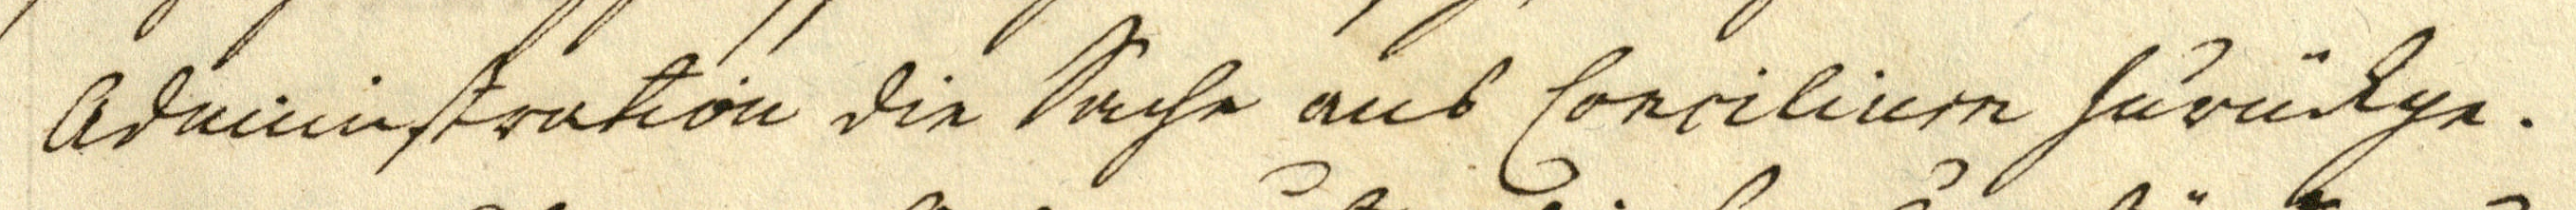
Administration die Sache ans Concilium zurückge-
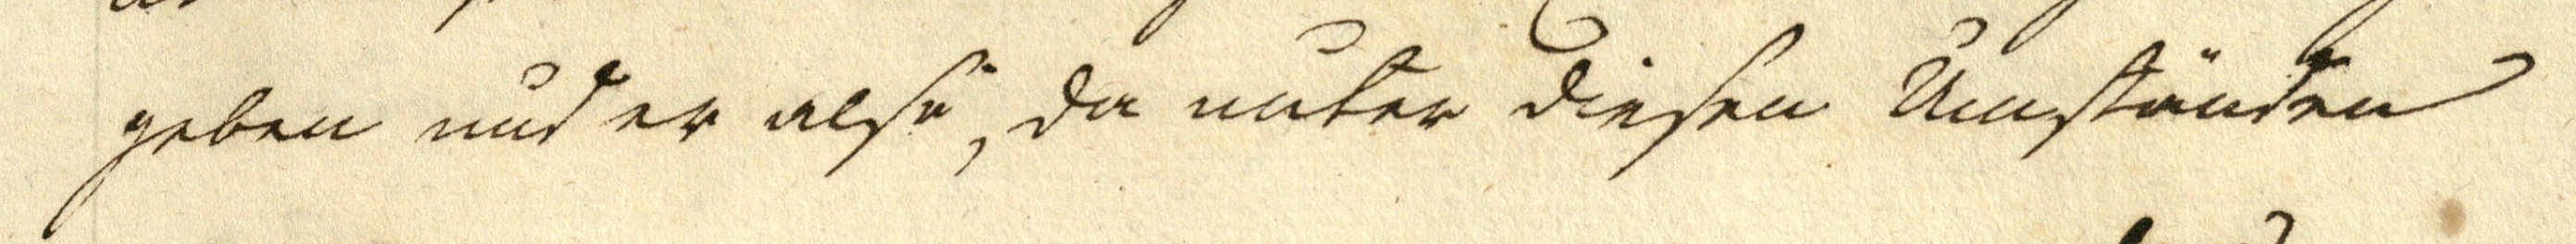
geben und er also, da unter diesen Umständen
